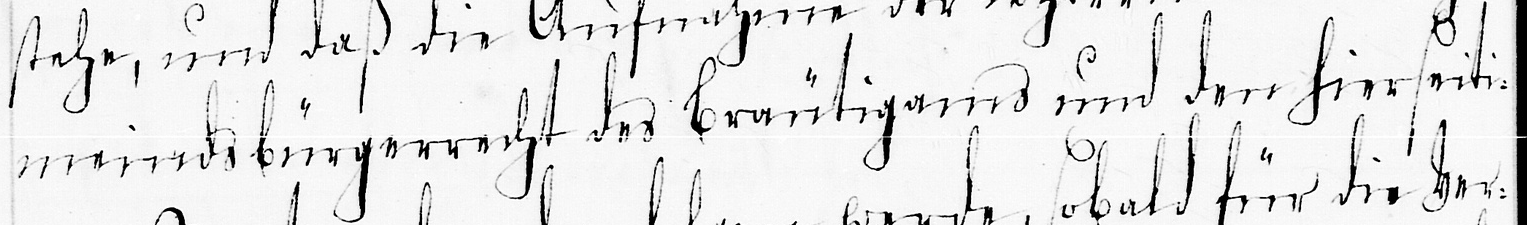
meindsbürgerrecht des Bräutigams und den hierseiti¬
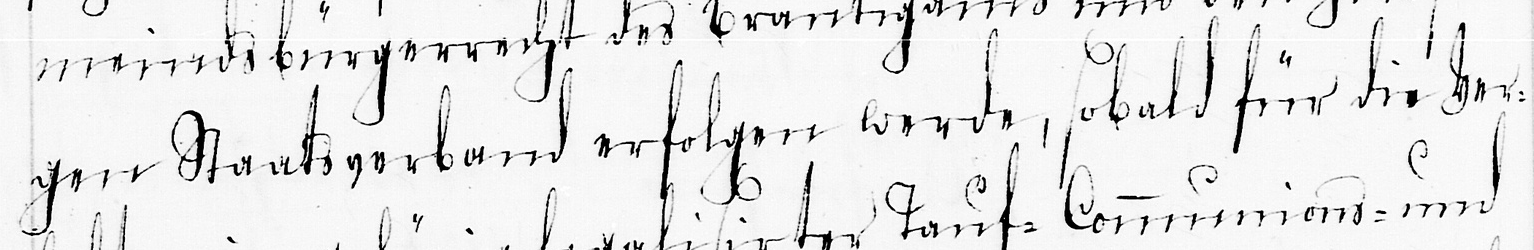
gen Staatsverband erfolgen werde, sobald für die Ver¬
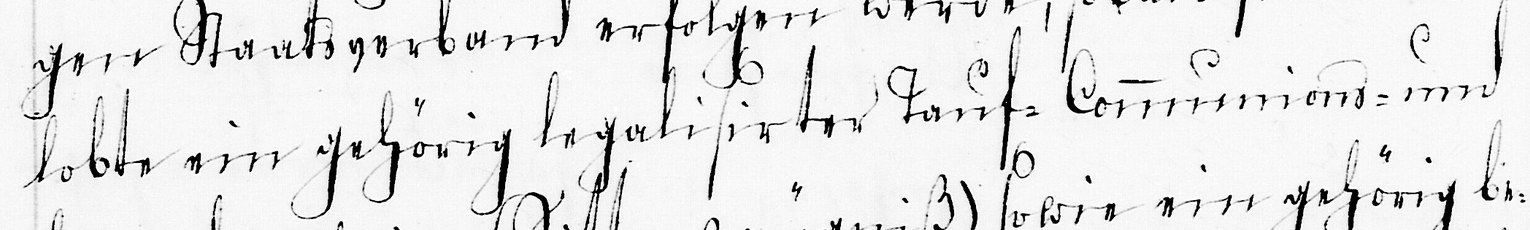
lobte ein gehörig legalisirter Tauf- Communions- und
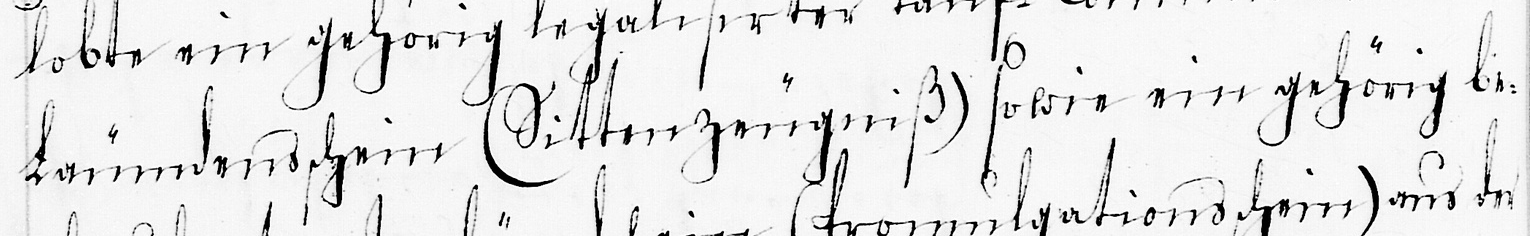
Läumdensschein (Sittenzeugniß) sowie ein gehörig be¬
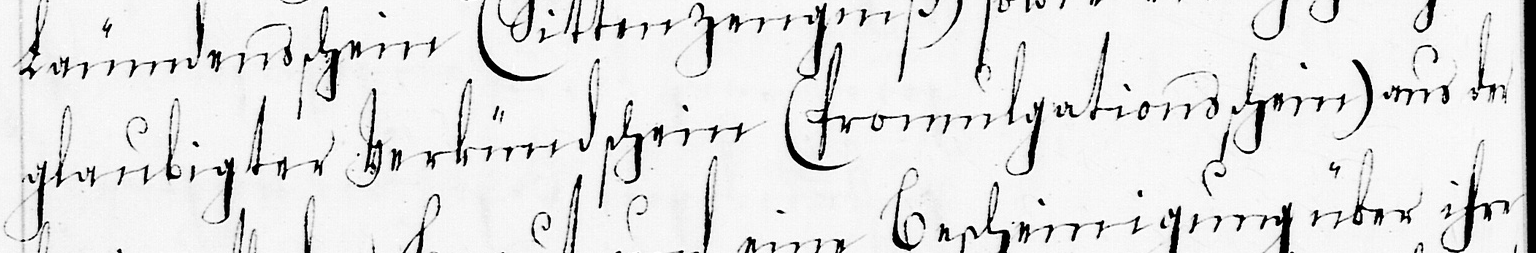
glaubigter Verkündschein (Promulgationsschein) aus der
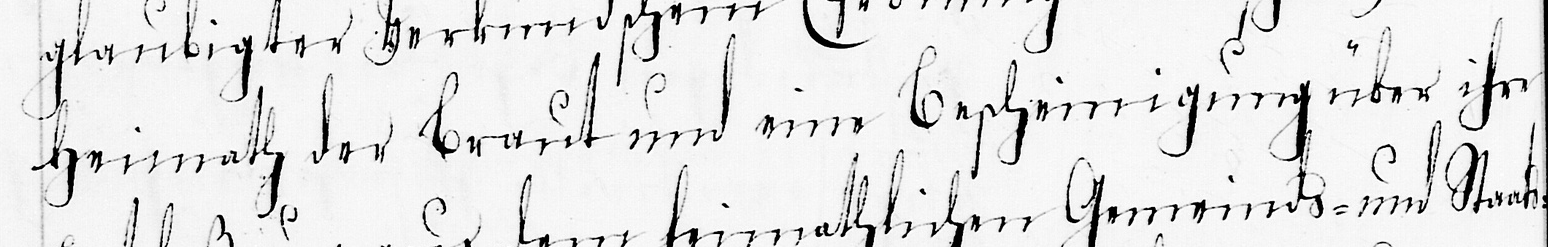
Heimath der Braut und eine Bescheinigung über ihre
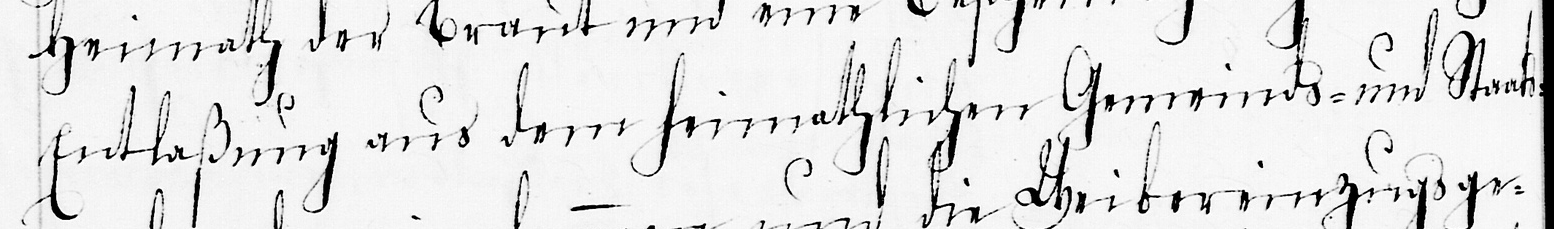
Entlaßung aus dem heimathlichen Gemeinds- und Sta¬
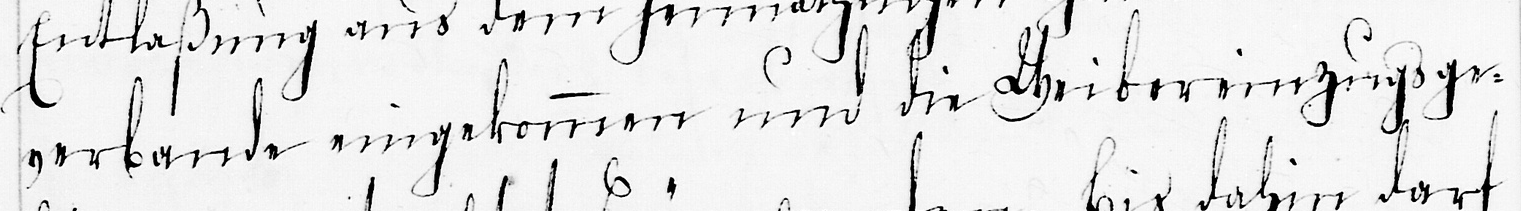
verbande eingekommen und die Weibereinzugsge¬
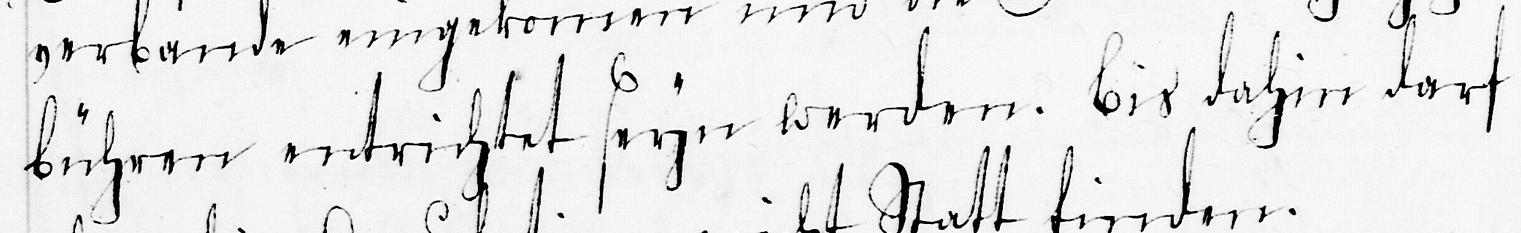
bühren entrichtet seyn werden. Bis dahin darf
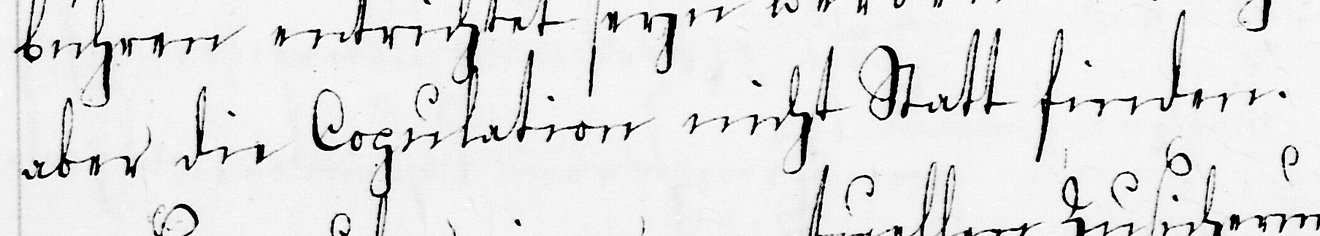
aber die Copulation nicht Statt finden.
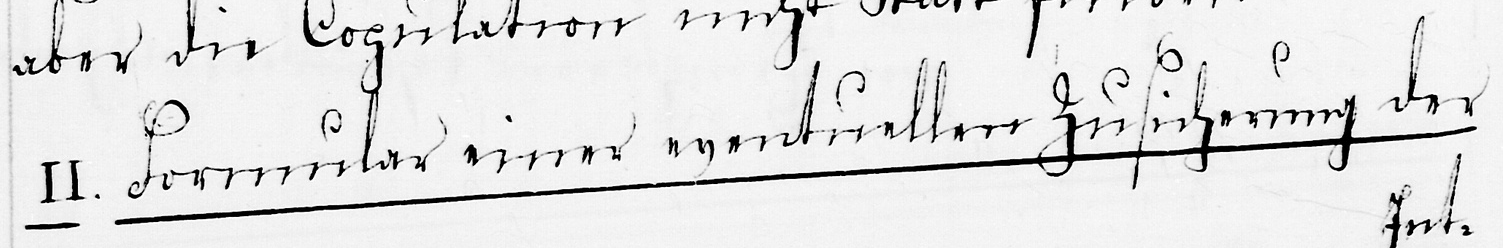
II. Formular einer eventuellen Zusicherung der
